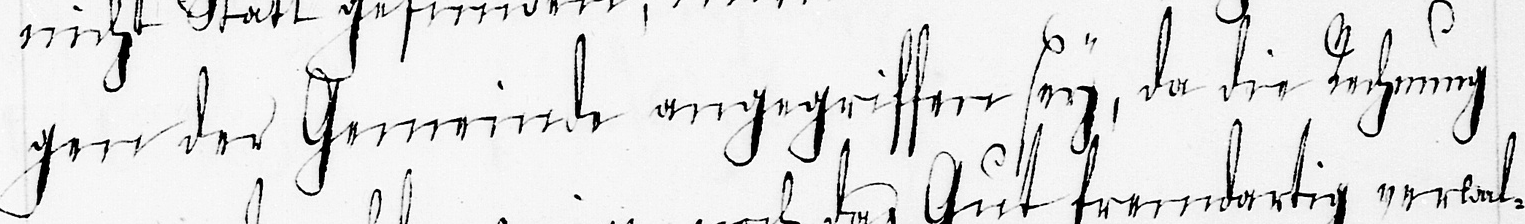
gen der Gemeinde angegriffen sey, da die Rechnung
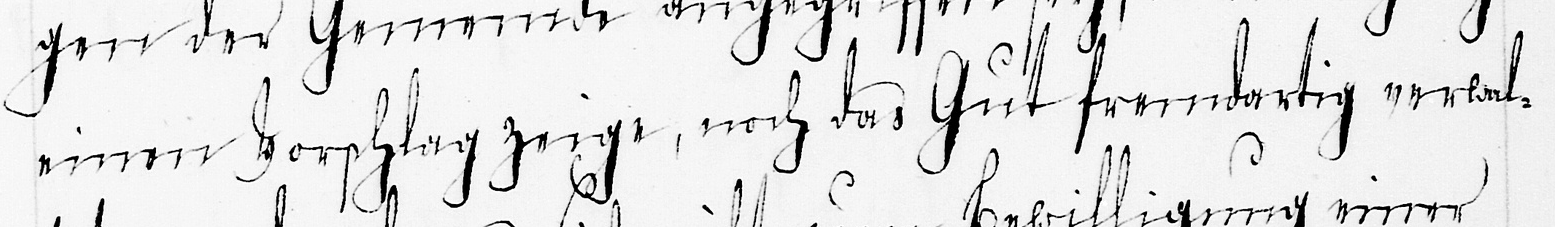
einen Vorschlag zeige, noch das Gut fremdartig verwal¬
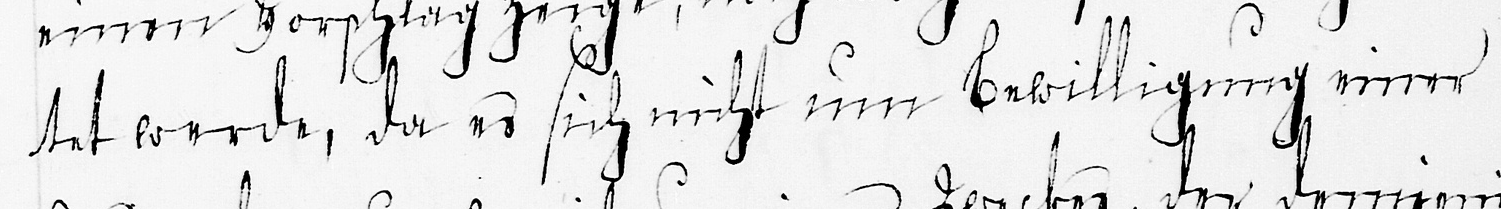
tet werde, da es sich nicht um Bewilligung einer
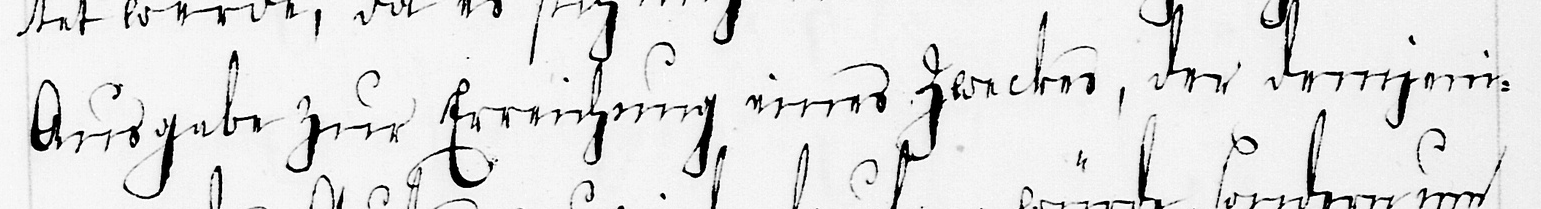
Ausgabe zur Erreichung eines Zweckes, der demjeni¬
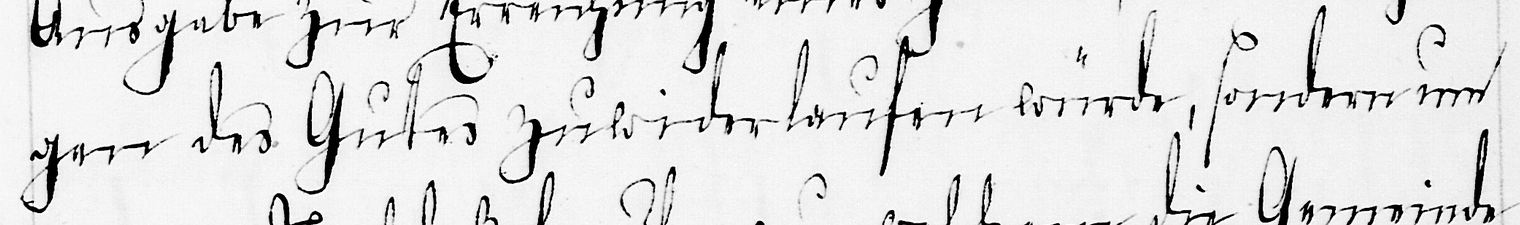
gen des Gutes zuwiderlaufen würde, sondern um
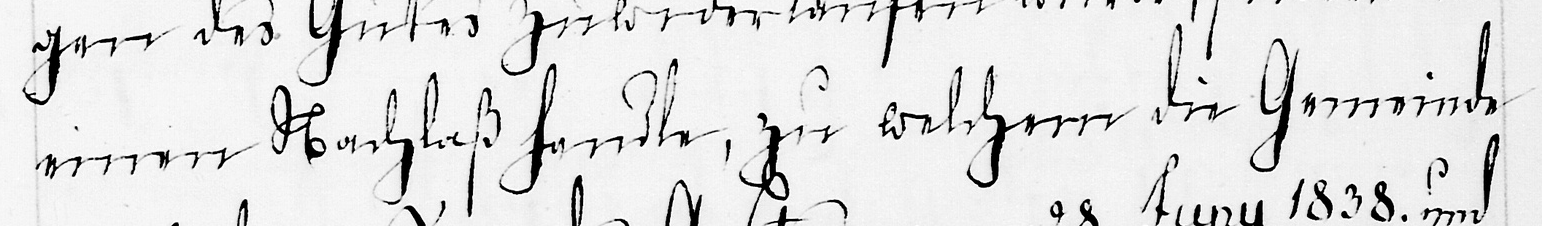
einen Nachlaß handle, zu welchem die Gemeinde
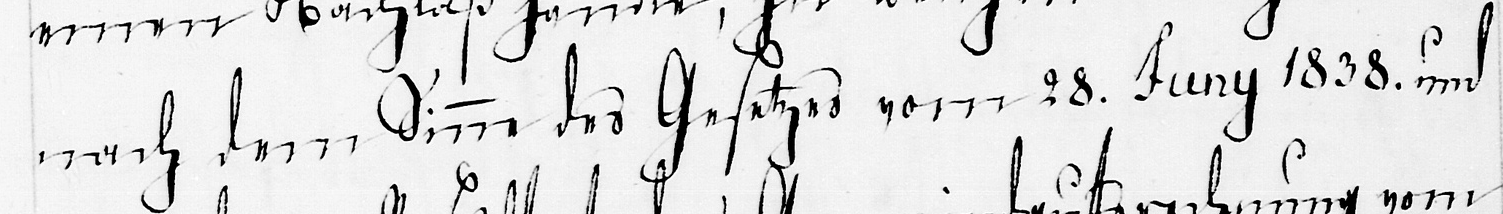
nach dem Sinne des Gesetzes vom 28. Juny 1838. und
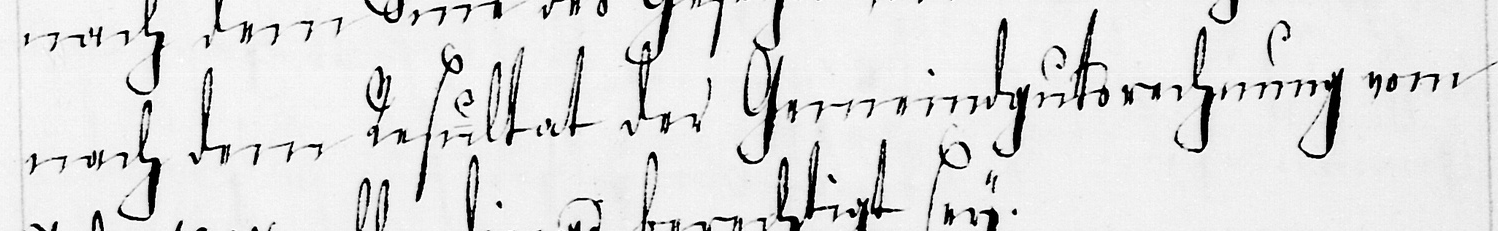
nach dem Resultat der Gemeindgutsrechnung vom
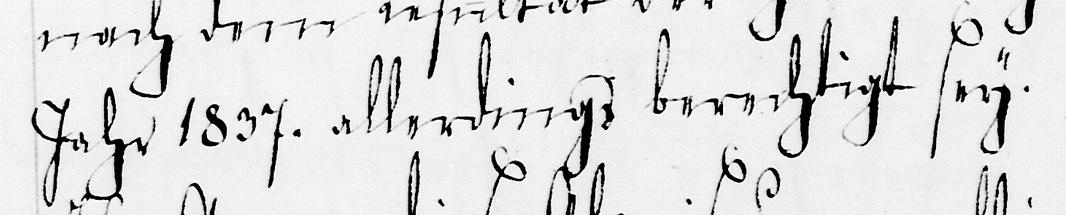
Jahr 1837. allerdings berechtigt sey.
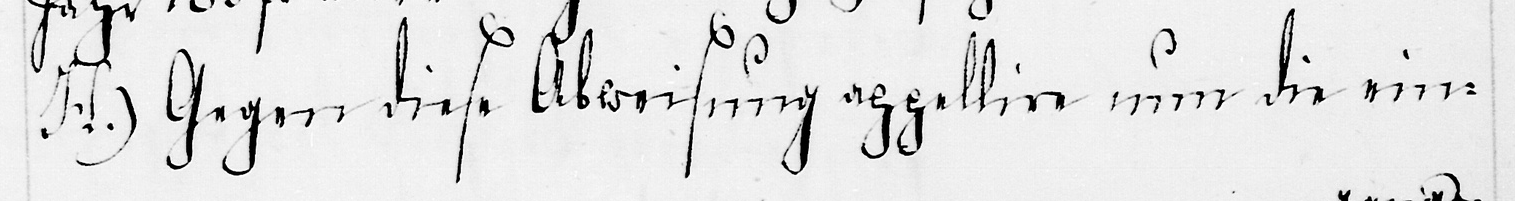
H.) Gegen diese Abweisung appellire nun die ein-
